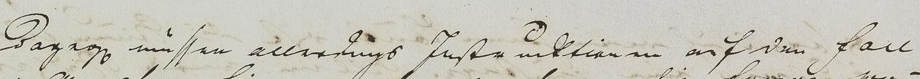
Dagegen müssen allerdings Instrucktionen auf den Fall
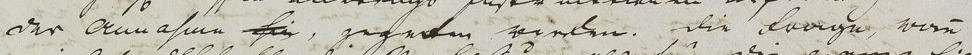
der Annahme hin gegeben werden. Die Frage, wann
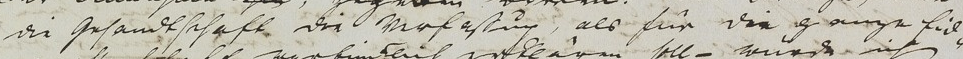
die Gesandtschaft die Verfassung, als für die ganze Eid-
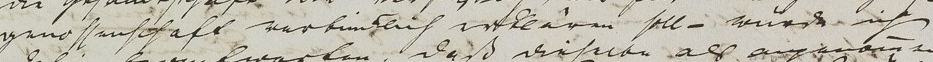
genossenschaft verbindlich erklären soll – würde ich
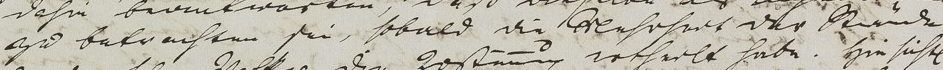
zu betrachten sei, sobald die Mehrheit der Stände
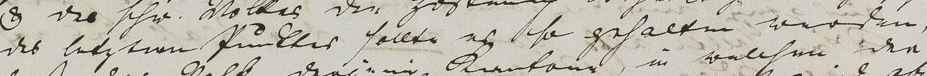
des letztern Punktes sollte es so gehalten werden,
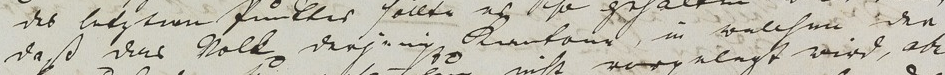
daß das Volk derjenigen Kantone, in welchen der
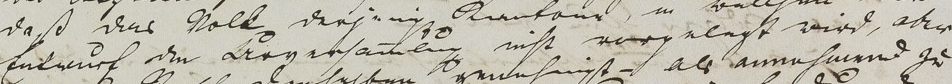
Entwurf den Urversammlungen nicht vorgelegt wird, aber
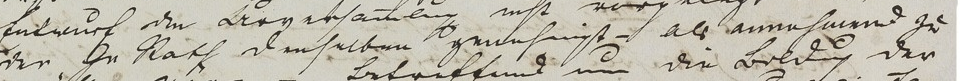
der Gr. Rath denselben genehmigt – als annehmend zu
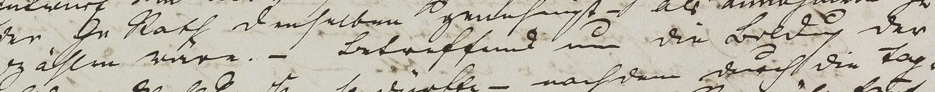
zählen wäre. – Betreffend nun die Bildung der
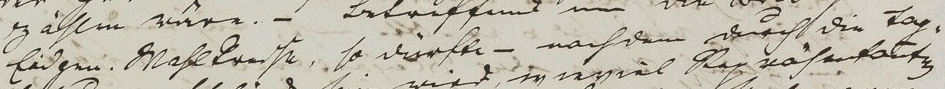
Eidgen. Wahlkreise, so dürfte – nachdem durch die Tag-
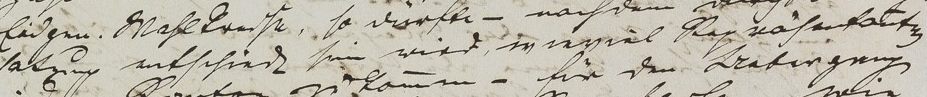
satzung entschieden sein wird, wieviel Repräsentanten
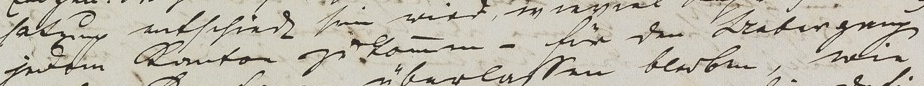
jedem Kanton zukommen – für den Uebergang
